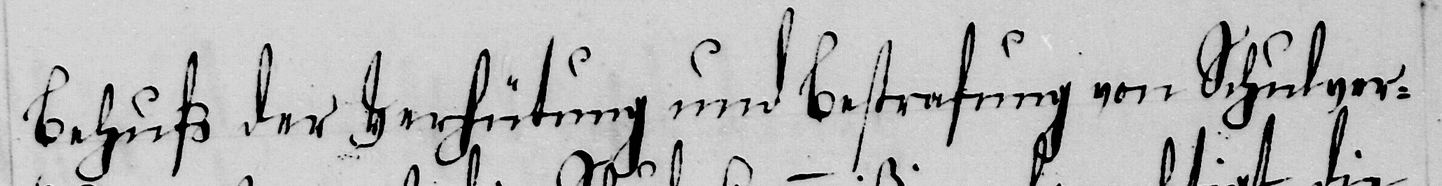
Behufs der Verhütung und Bestrafung von Schulver¬
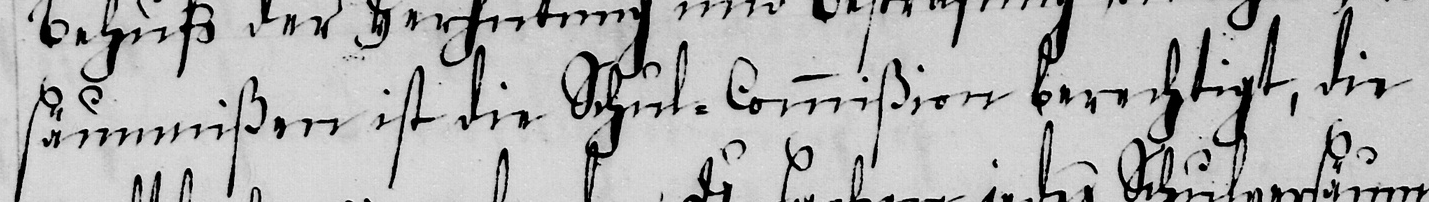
säumnißen ist die Schul-Commißion berechtigt, die
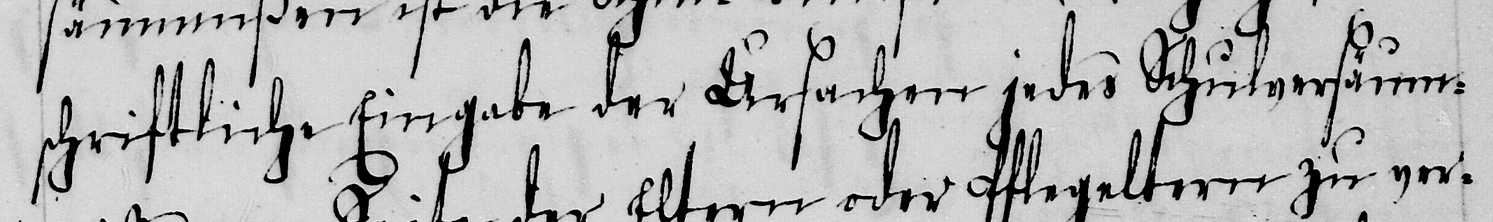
schriftliche Eingabe der Ursachen jedes Schulversäum¬
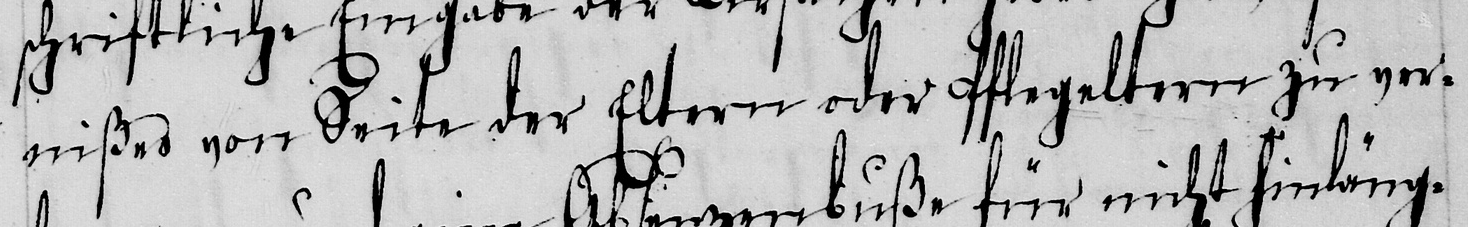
nißes von Seite der Eltern oder Pflegeltern zu ver¬
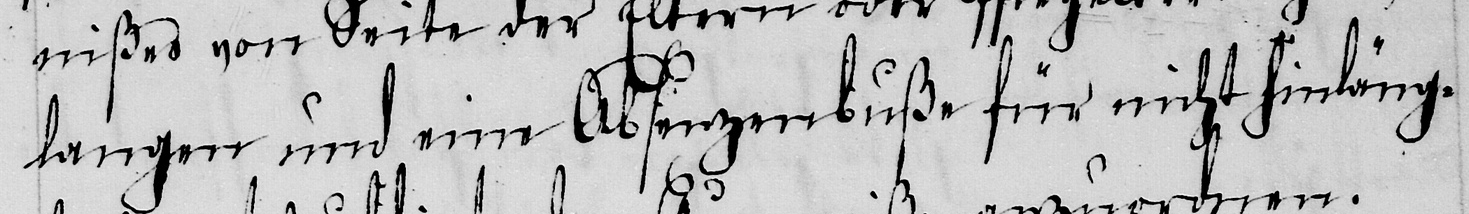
langen und eine Absenzenbuße für nicht hinläng¬
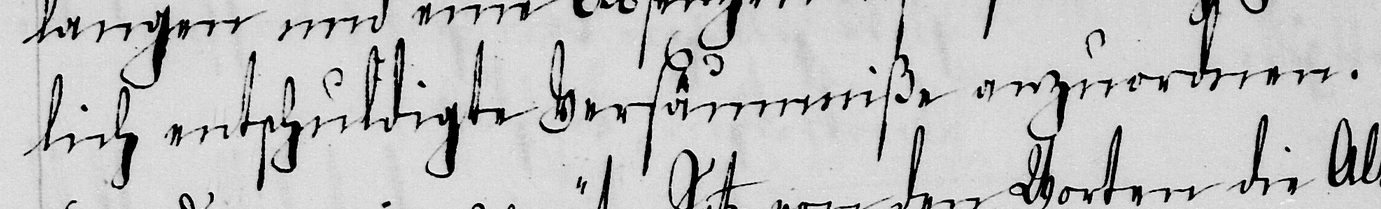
lich entschuldigte Versäumniße anzuordnen.
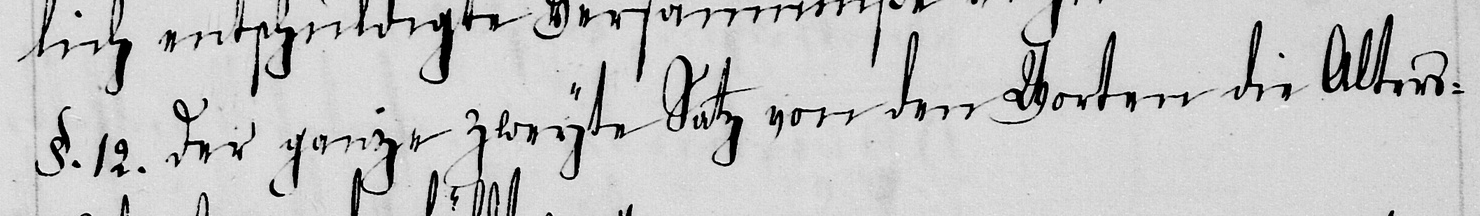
§. 12. Der ganze zweyte Satz von den Worten die Alters¬
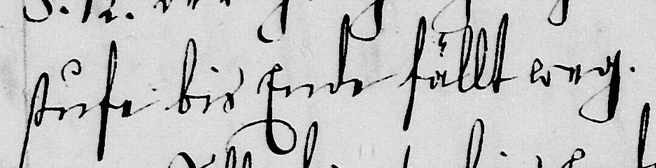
stufe bis Ende fällt weg.
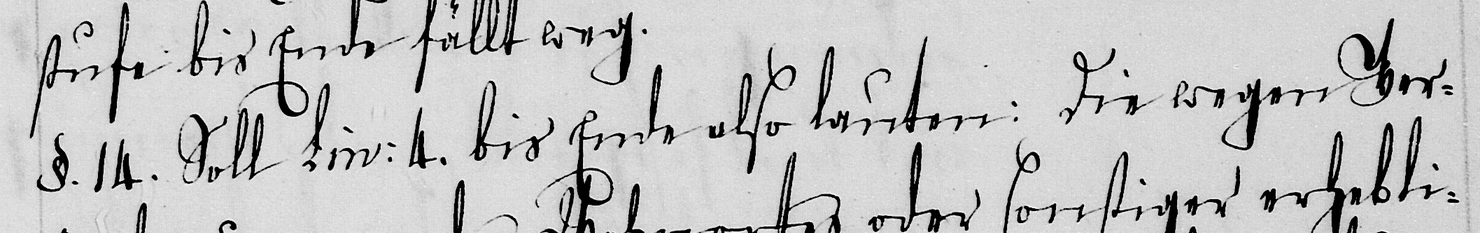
§. 14. Soll Lin: 4. bis Ende also lauten: Die wegen Ver¬
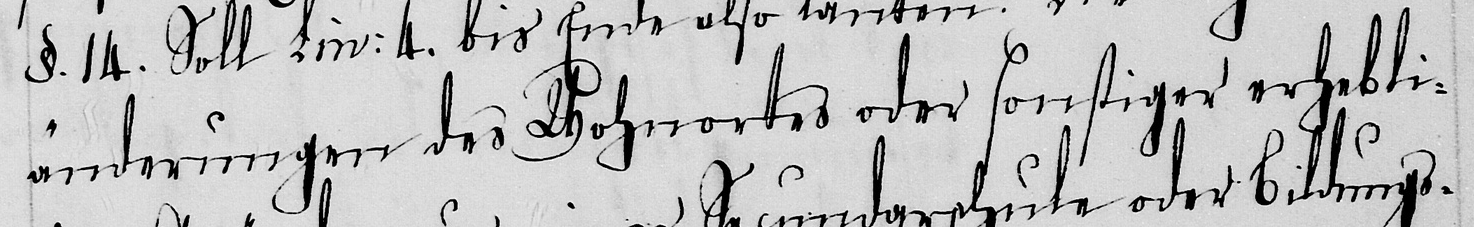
änderungen des Wohnortes oder sonstiger erhebli¬
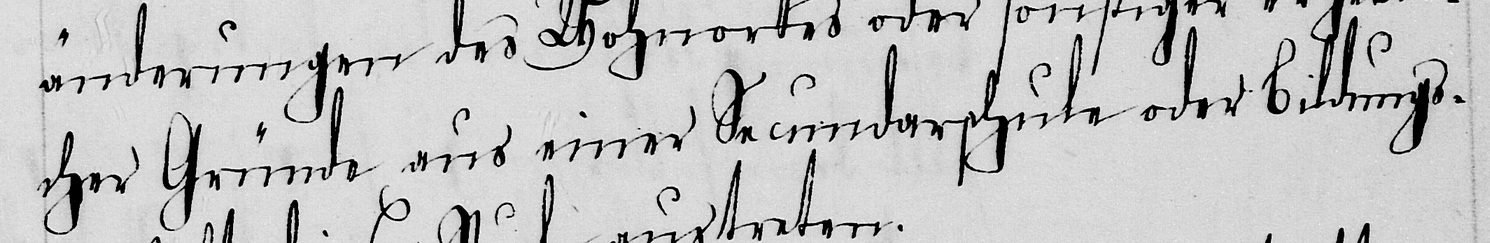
cher Gründe aus einer Secundarschule oder Bildungs¬
